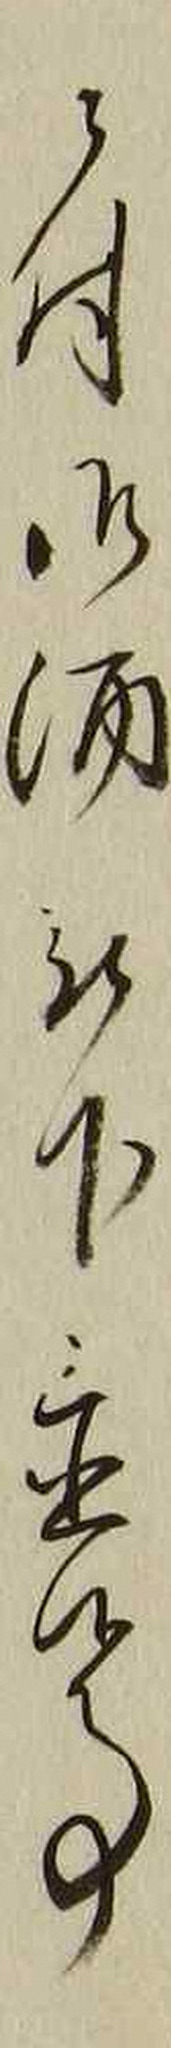に付御酒被下置候事
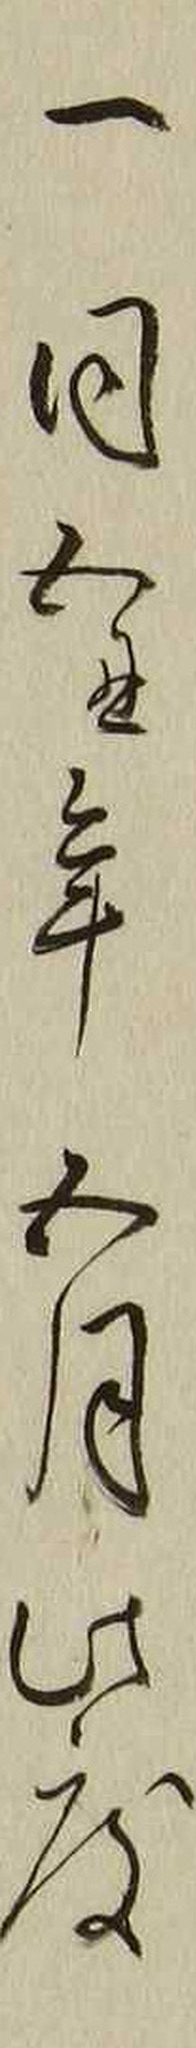一同五丑年五月此度
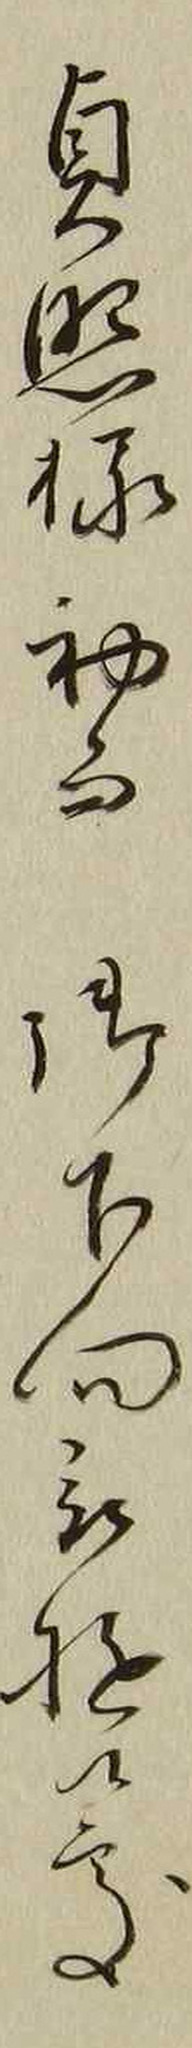貞照様初而御下向被遊候処
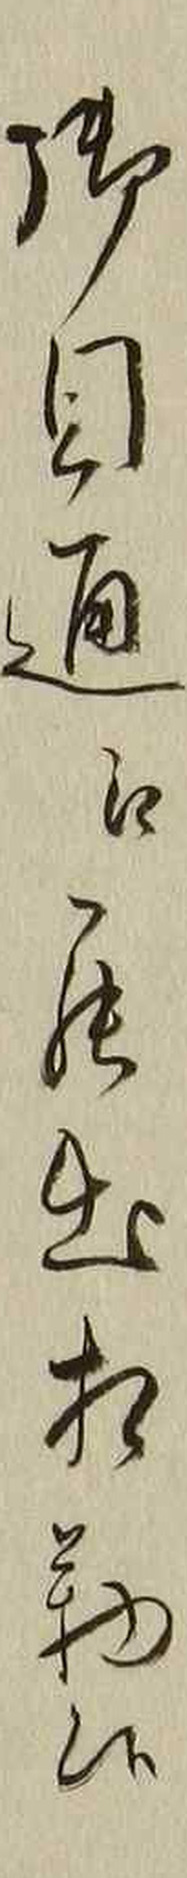御目通江罷出相勤候
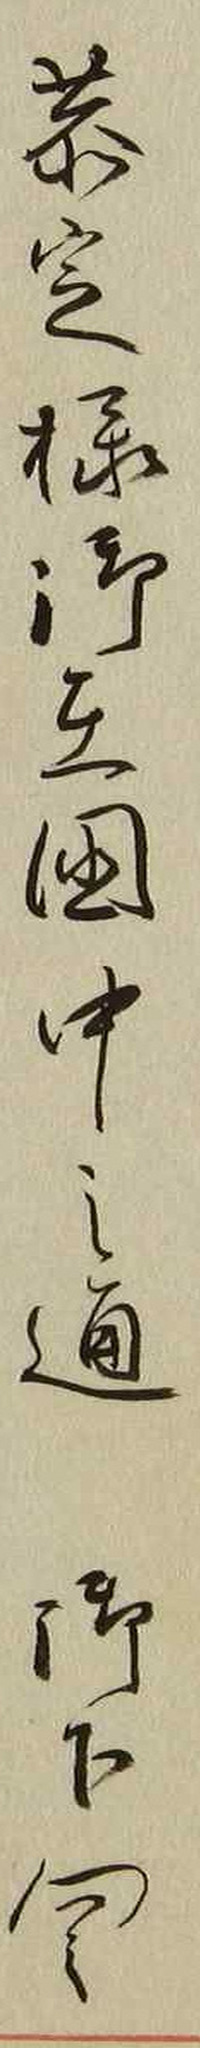恭定様御在国中之通御下向之
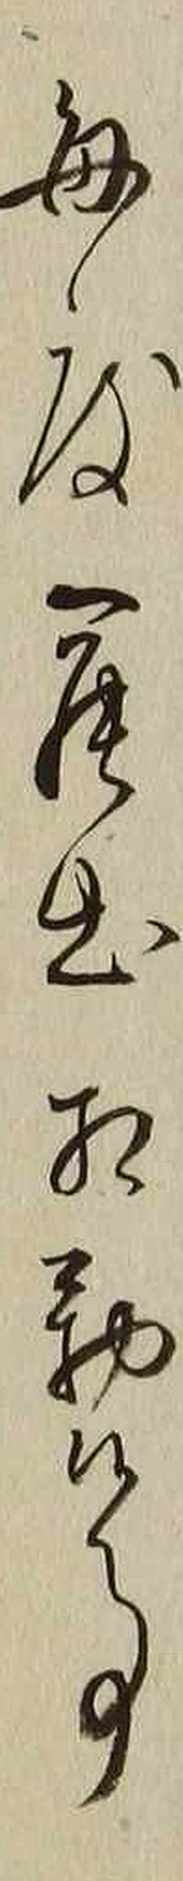毎度罷出相勤候事
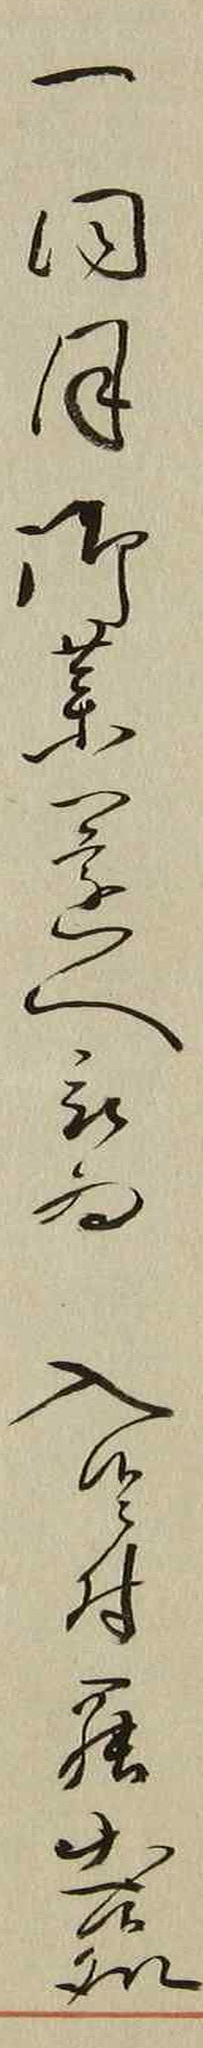一同月御薬園へ被為入候に付罷出候処
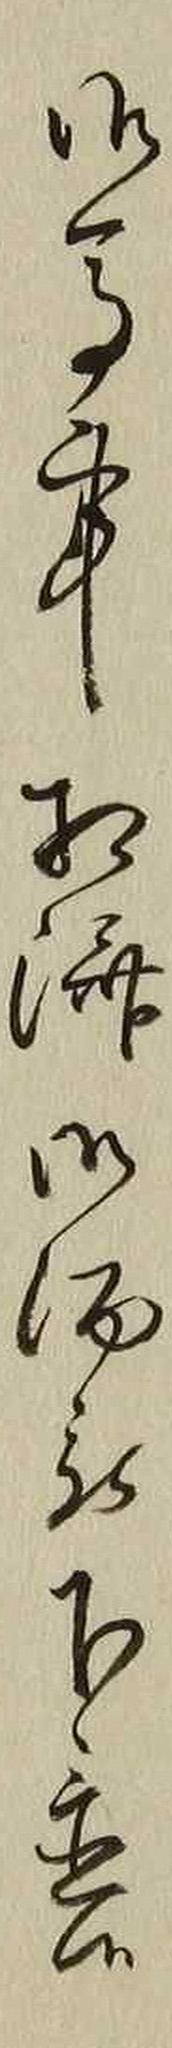御馬事相済御酒被下置候
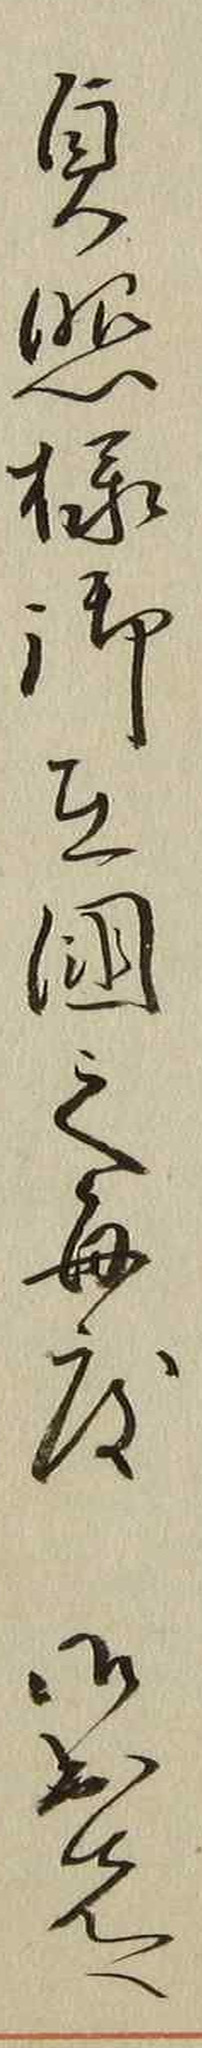貞照様御在国之毎度御出先へ
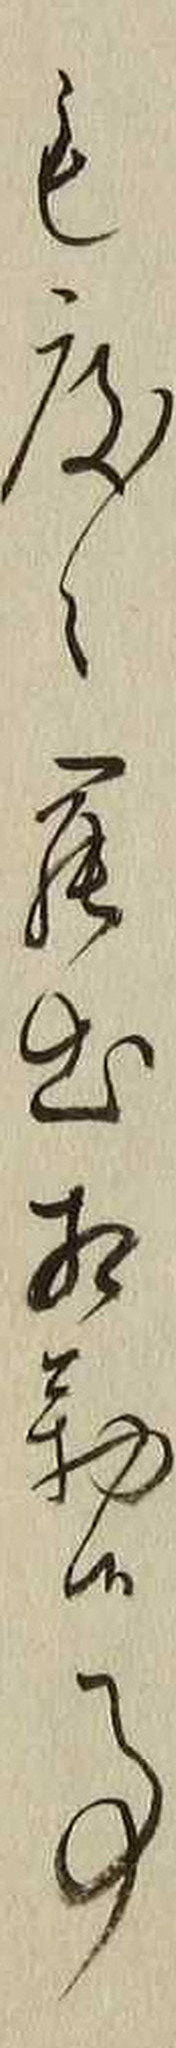も度々罷出相勤候事
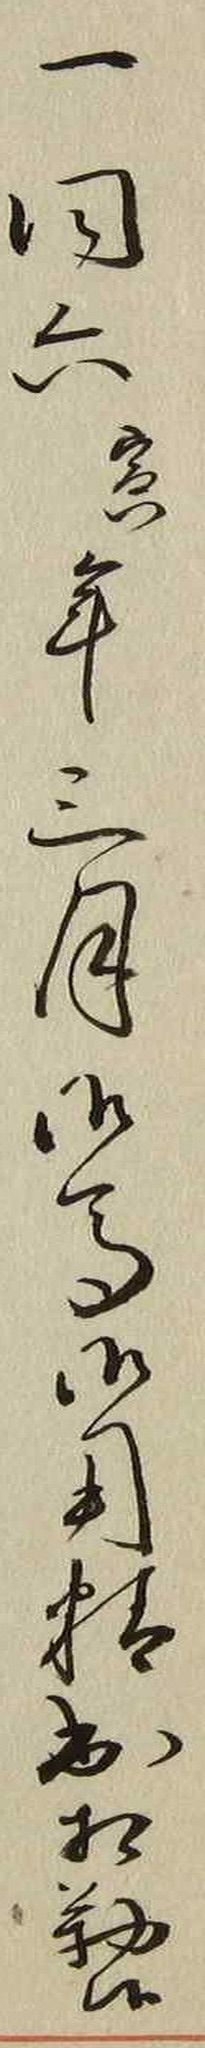一同六寅年三月御馬御用精出相勤候
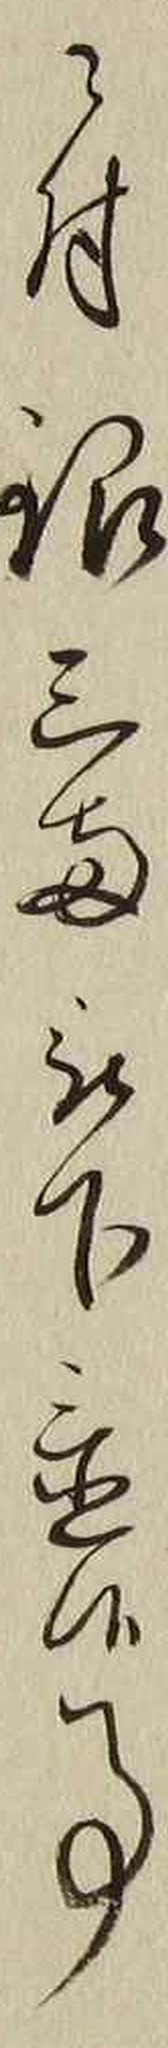に付銀三両被下置候事
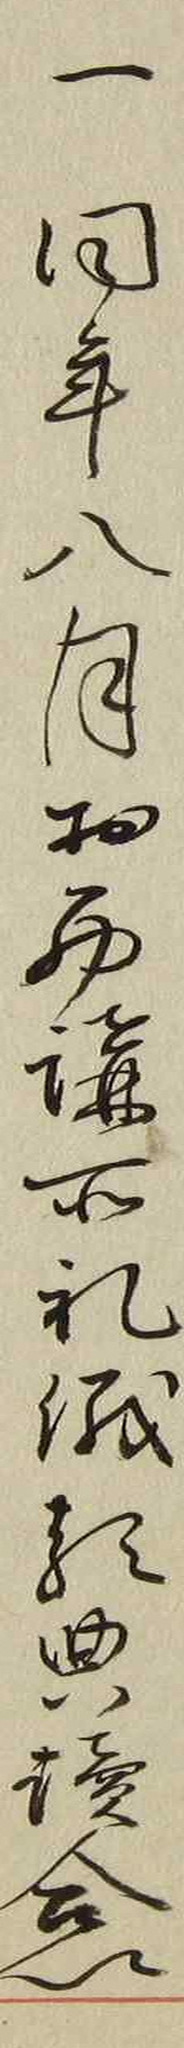一同年八月於西講所礼儀類典読合い
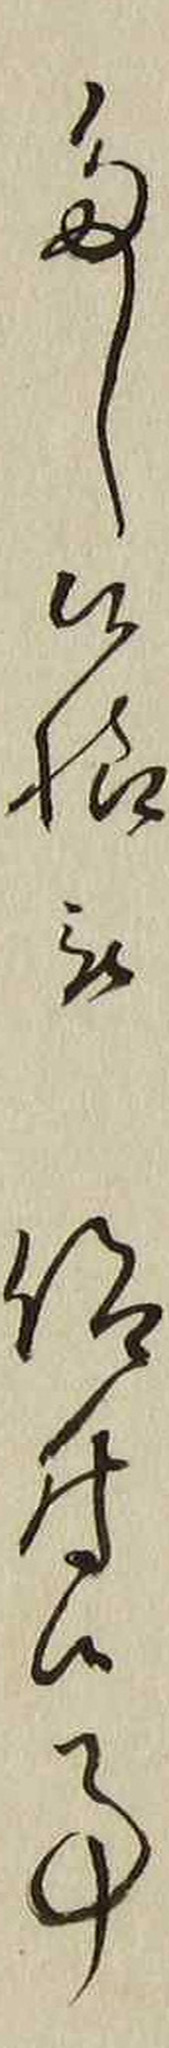たし候様被仰付候事
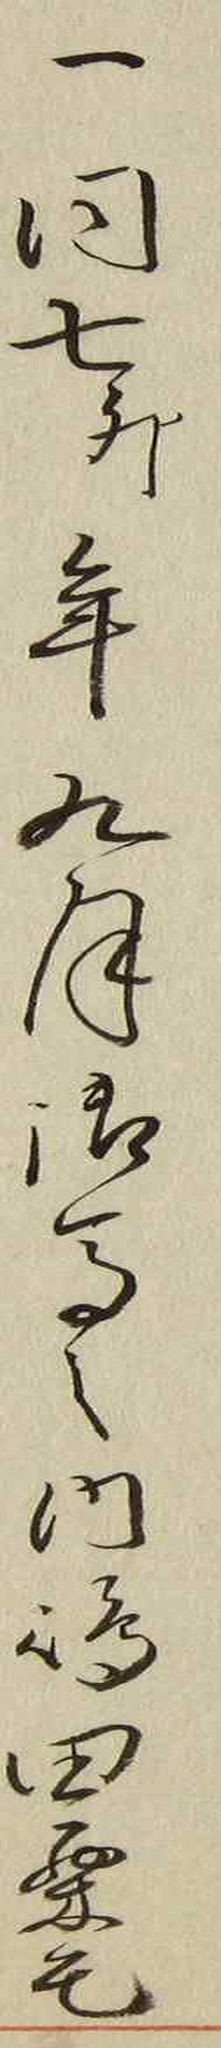一同七卯年九月御馬之内嶋田栗毛
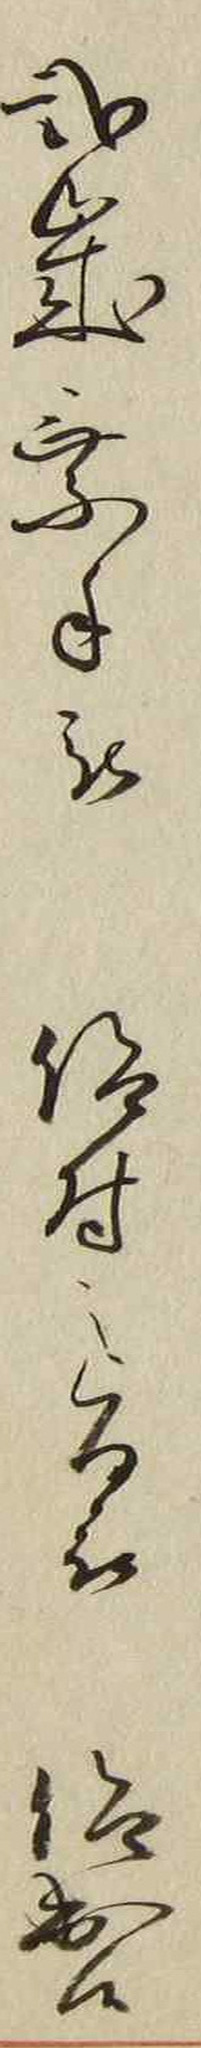弐歳乗手被仰付之旨被仰出候
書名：諸士系譜　巻之3　い之部3
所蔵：会津若松市立会津図書館
